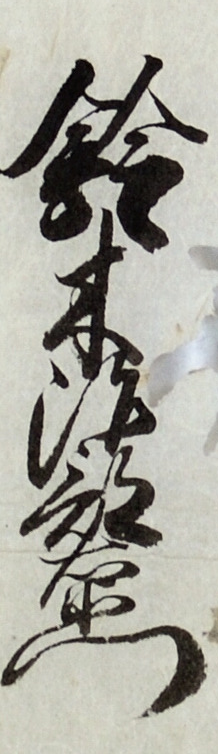鈴木治部右衛門
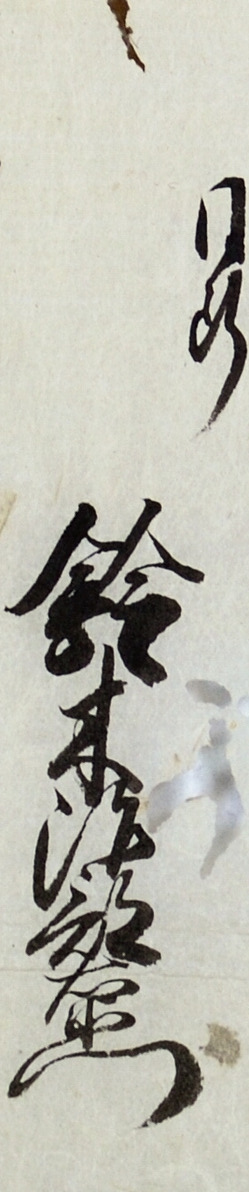鈴木治部右衛門
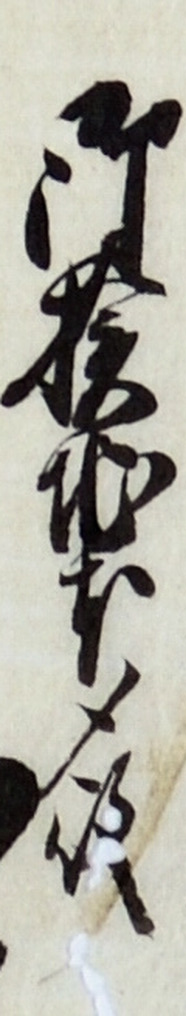御検地本〆役
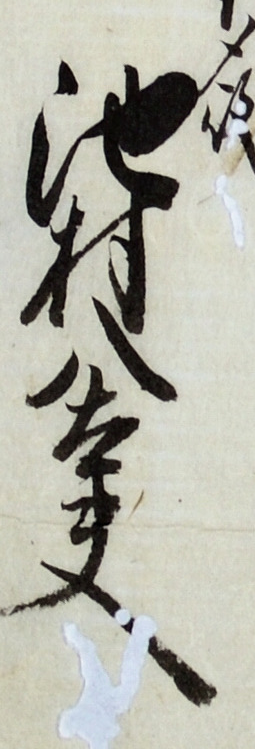池村八太夫
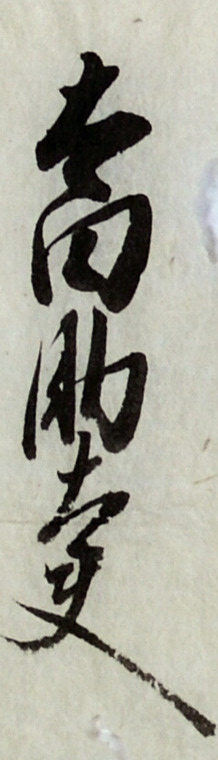太田助太夫
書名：信濃国伊奈筑摩両郡村々御林改帳
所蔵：伊那市立高遠町図書館・合同会社AMANE
